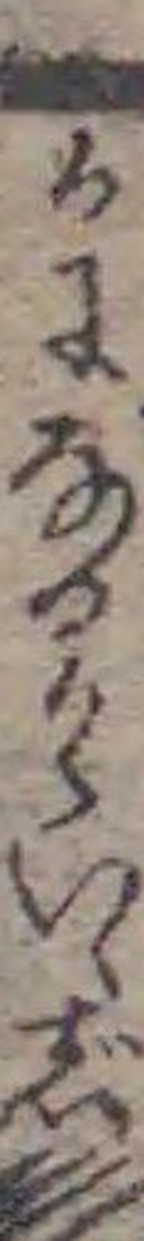かになるからいゝじ
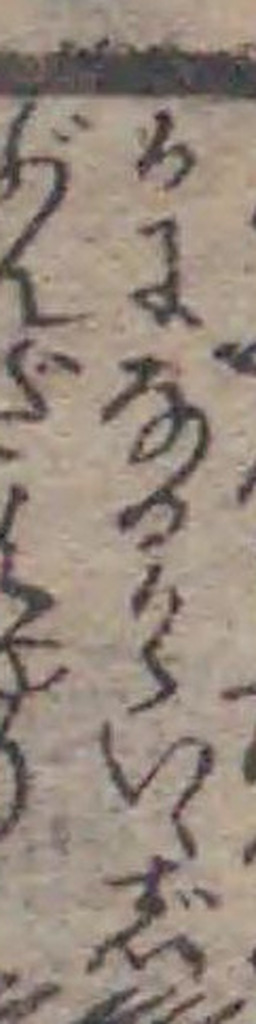ぶんだはやり
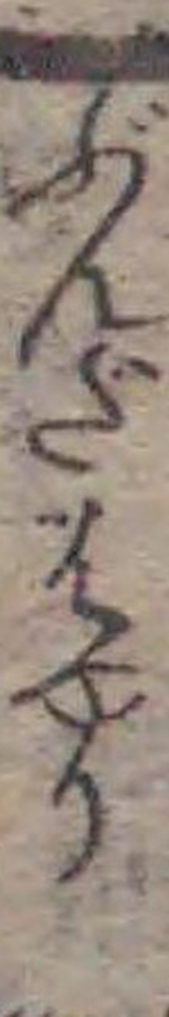ぶんだはやり
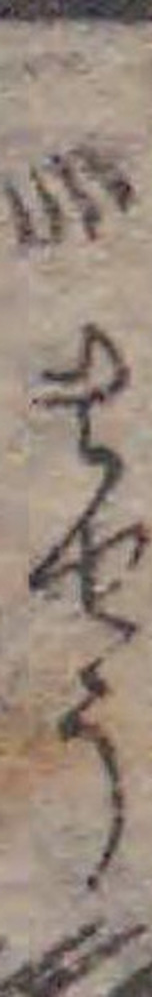ませう
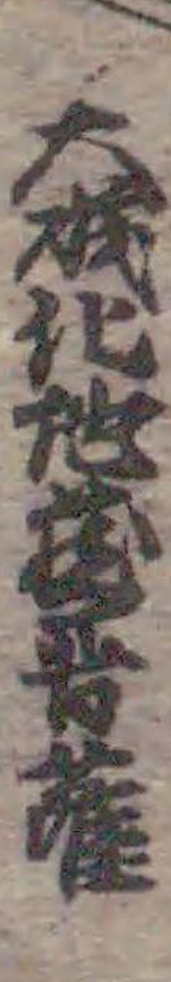大磯化地蔵菩薩
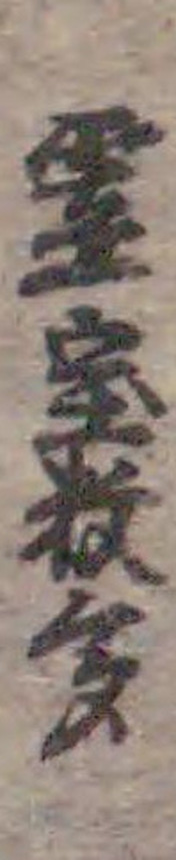霊宝数多
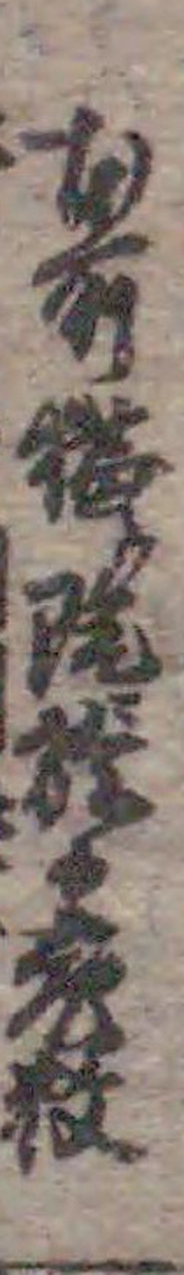本所猫ゥ院に於而夜数
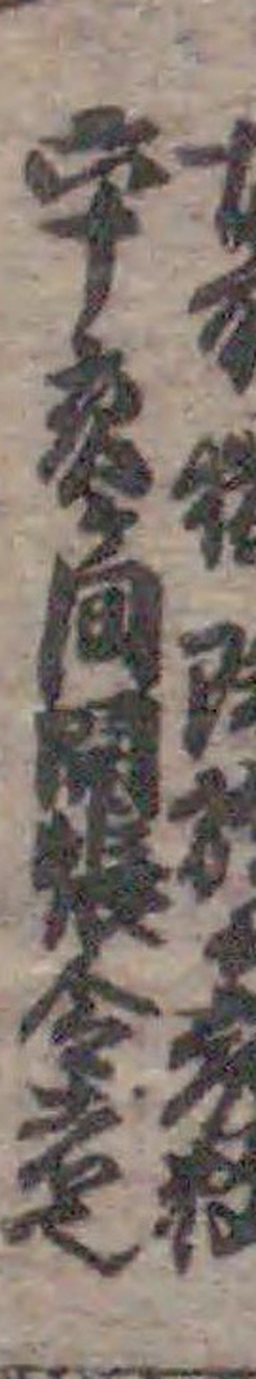六十夜ヶ間開帳令者也

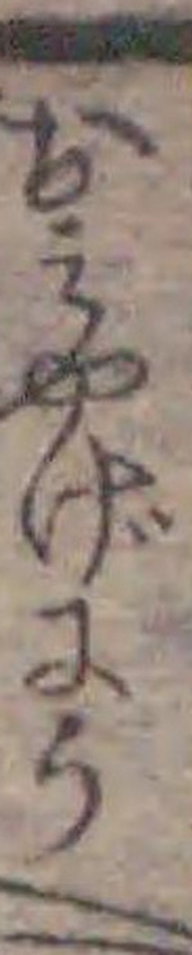おみやげにう
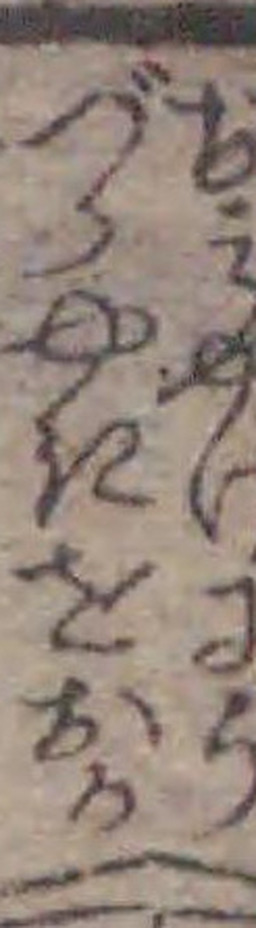づらやきをおか
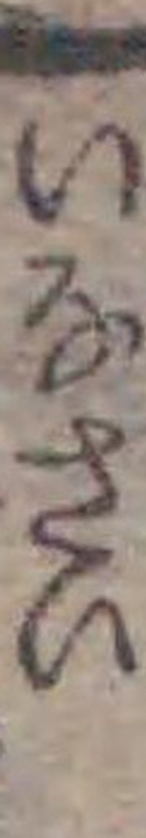いなさい
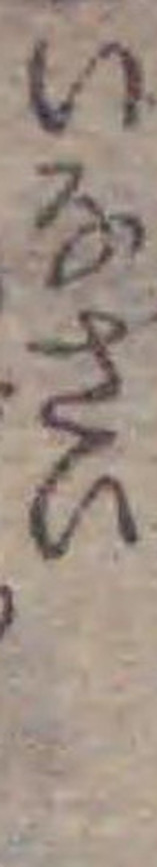いなさい
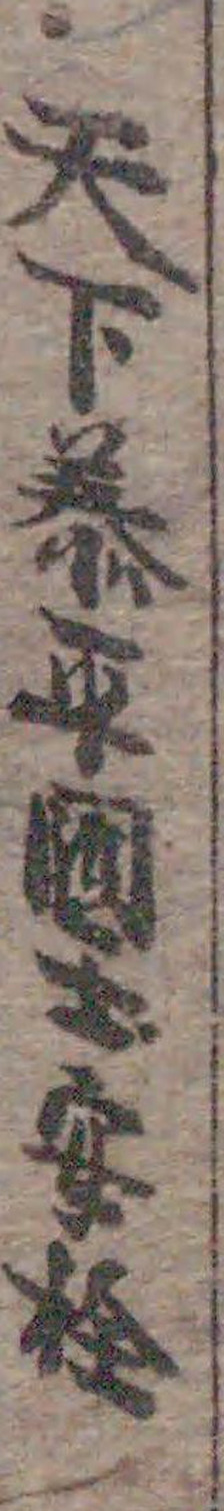天下泰平国土安栓
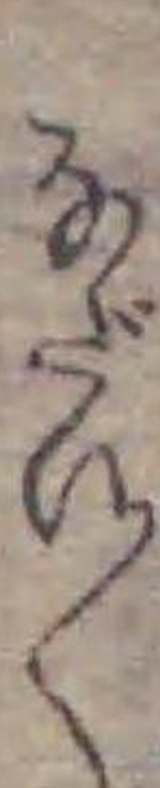なだい〳〵
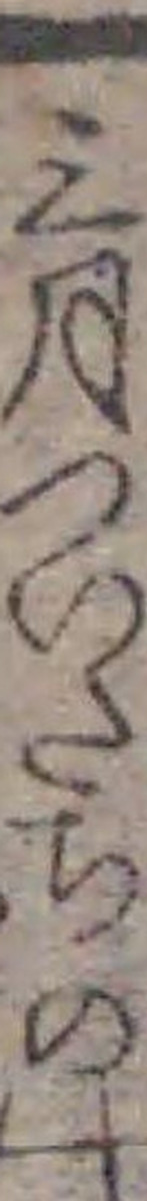三月ついたちの
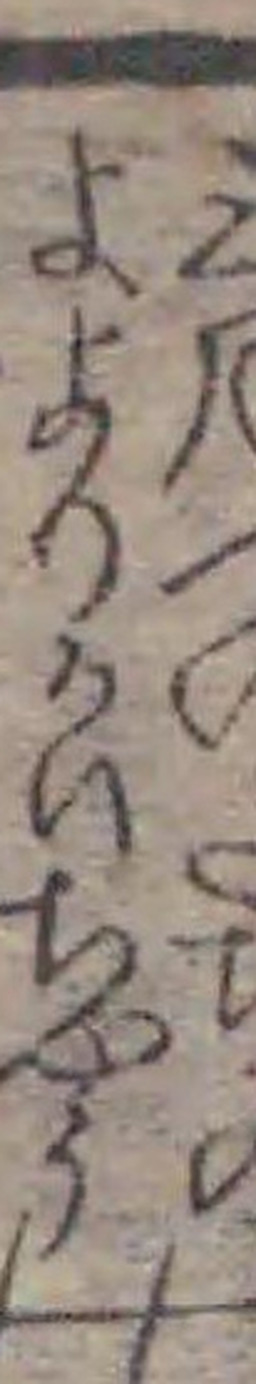よよりかいちやう
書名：化物七段目 : 2巻
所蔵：国立国会図書館 National Diet Library, JAPAN
